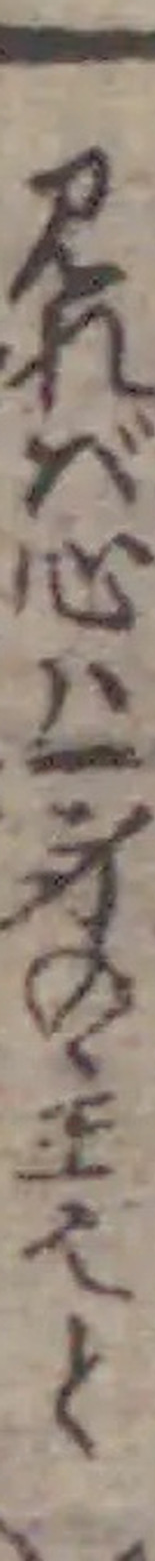見れば心は一身の主也と
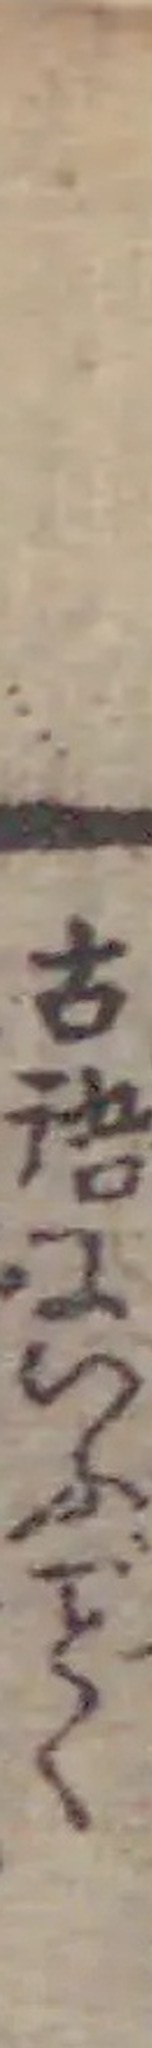古語にいふごとく
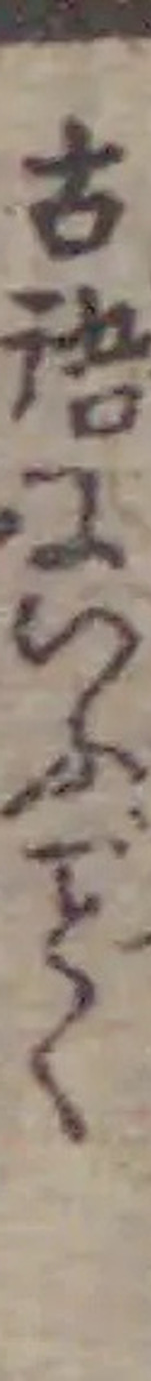古語にいふごとく
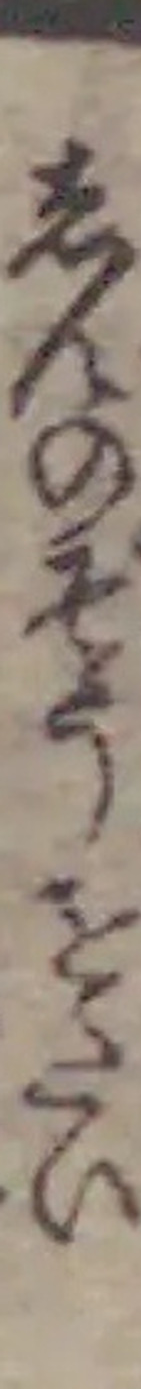しんのぞうをたい
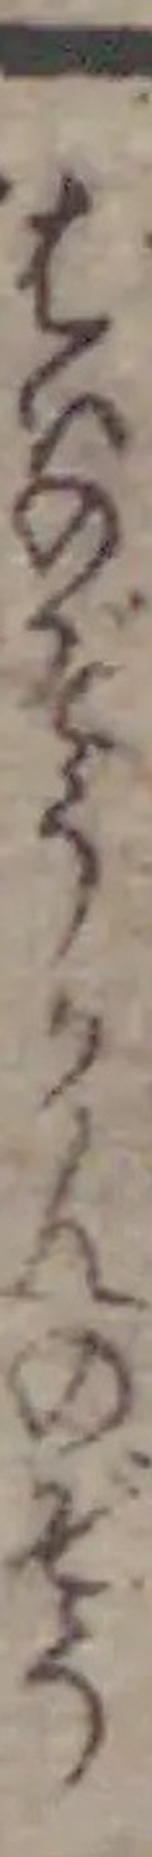はいのぞうかんのぞう
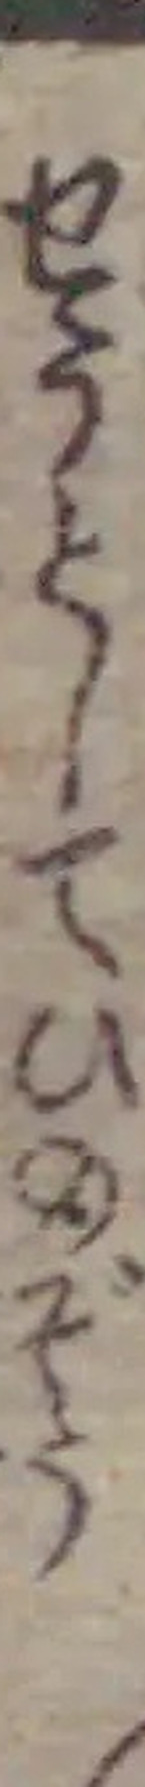せうとしてひのぞう
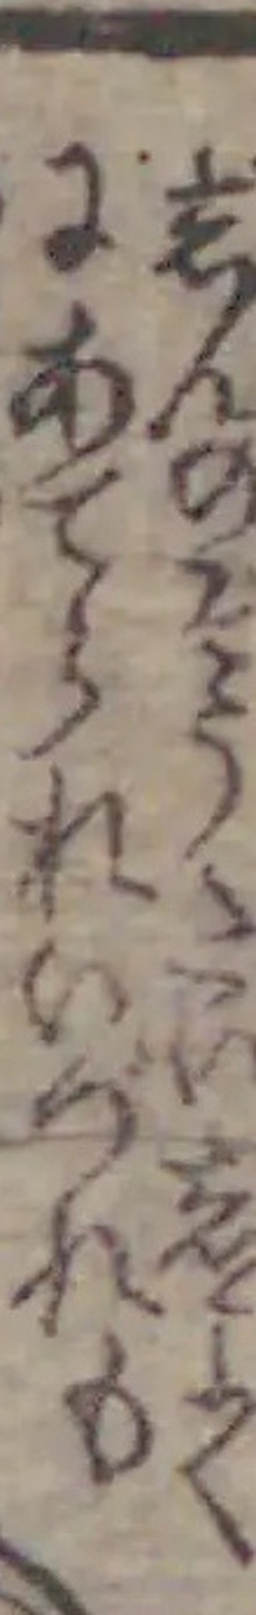にあてられいづれも
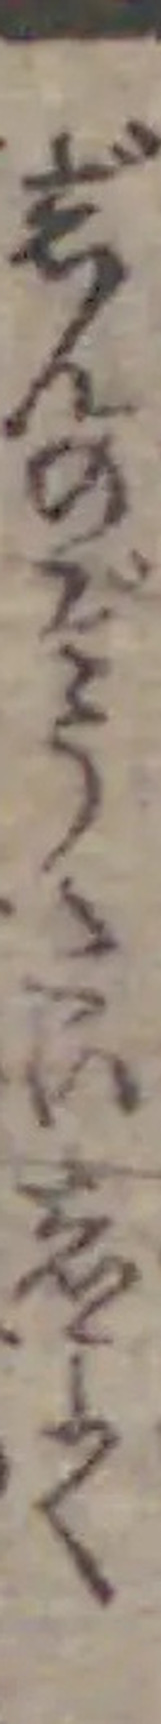じんのぞうたいしよく
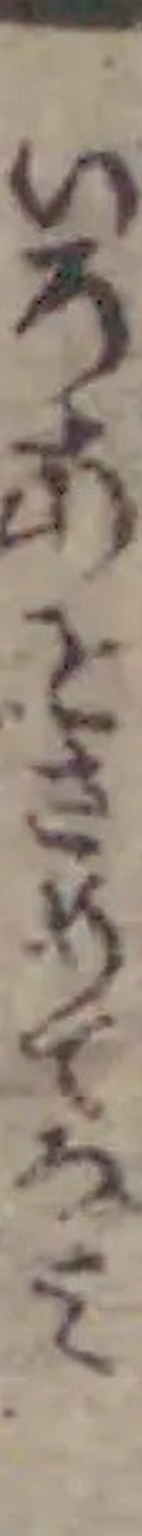いろあをさめてろみ
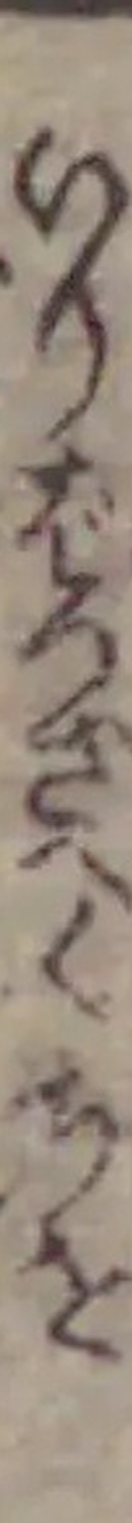いりばつざへくちを
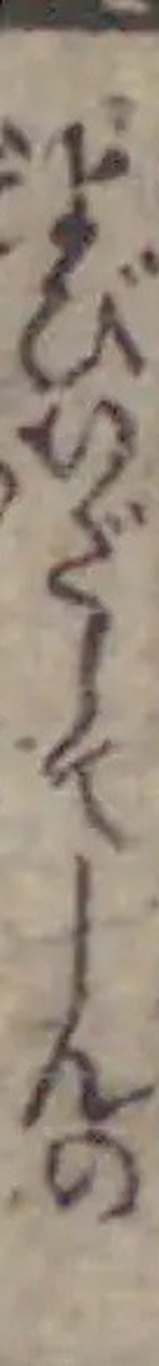よびいだしてしんの
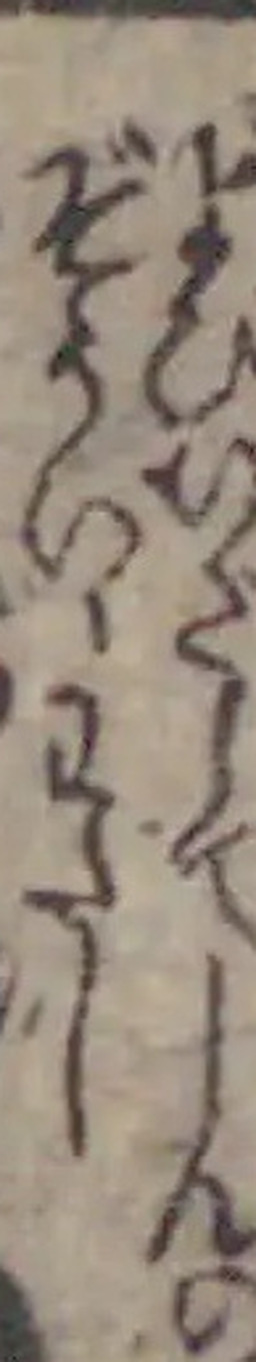ぞういゝわたし
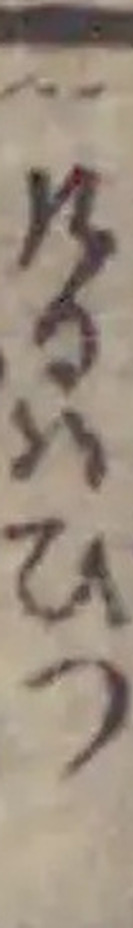けるはひつ
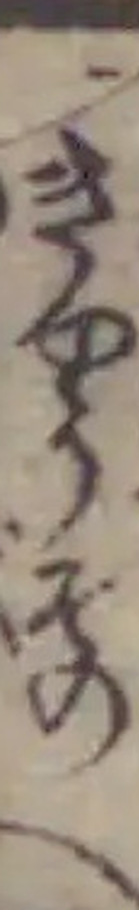きゆうその
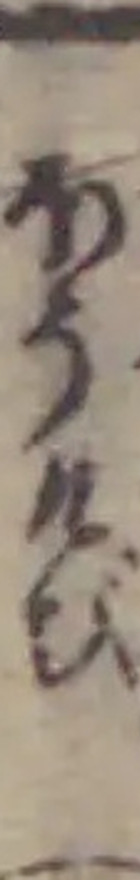ほうけび
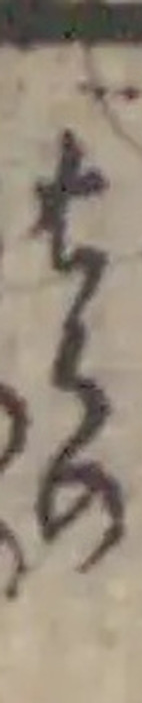はらの
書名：腹内養生主論 3巻
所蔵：国立国会図書館 National Diet Library, JAPAN
